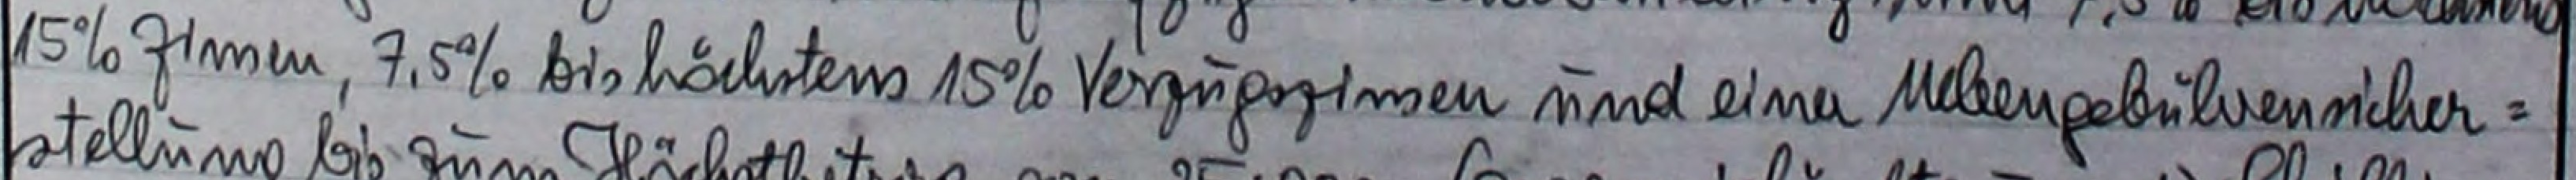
15% Zinsen, 7.5% bis höchstens 15% Verzugszinsen und einer Nebengebührensicher=
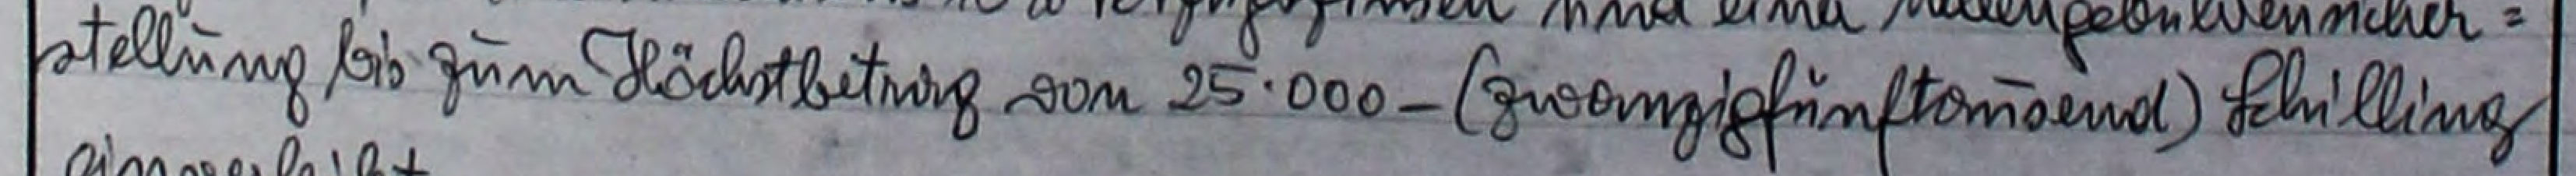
stellung bis zum Höchstbetrag von 25.000- (zwanzigfünftausend) Schilling
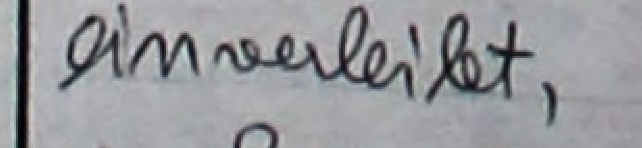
einverleibt,
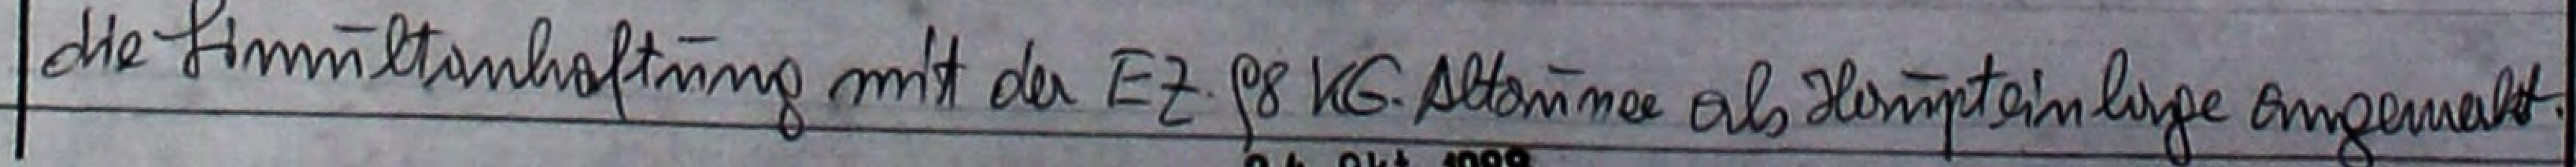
die Simultanhaftung mit der EZ G8 KG. Altaussee als Haupteinlage angemerkt.
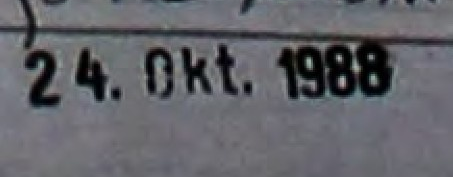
24. Okt. 1988
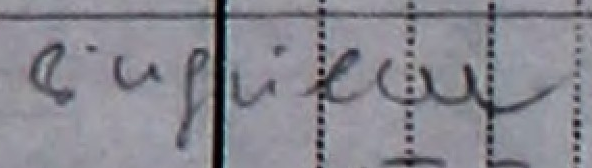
???lm
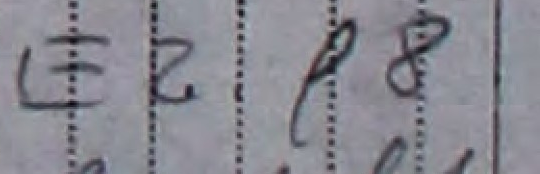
E Z P8
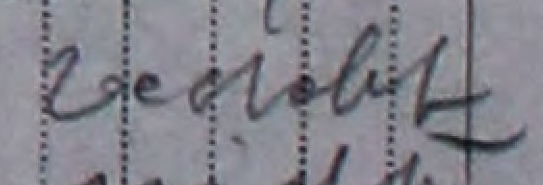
verlebt
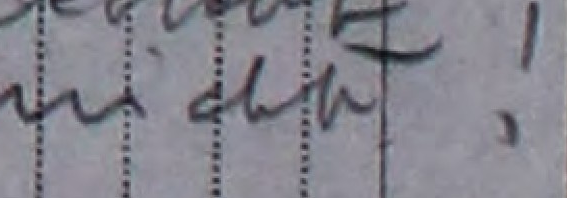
in du!
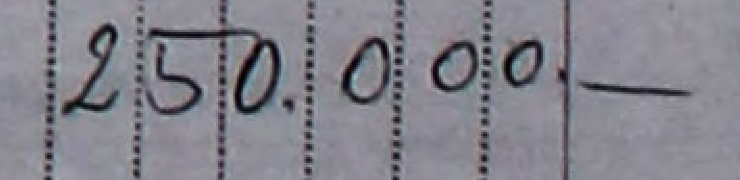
250.000.-
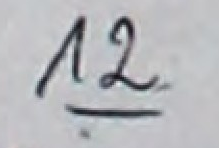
12
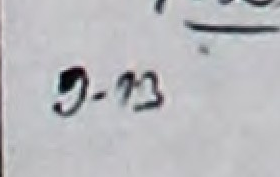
d-13
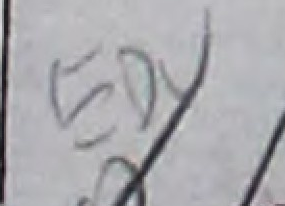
EDV
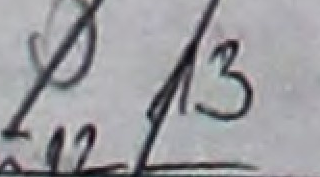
D 13
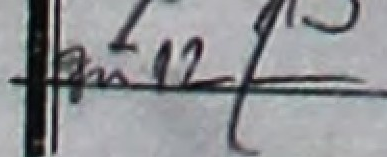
zu 12
